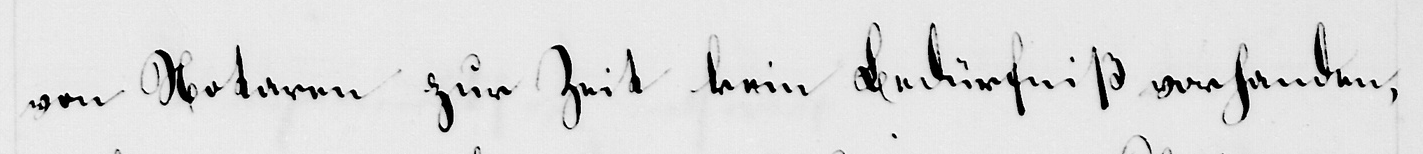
von Notaren zur Zeit kein Bedürfniß vorhanden,
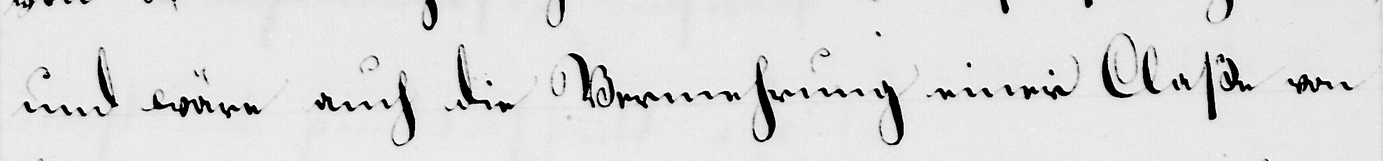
und wäre auch die Vermehrung einer Claße von
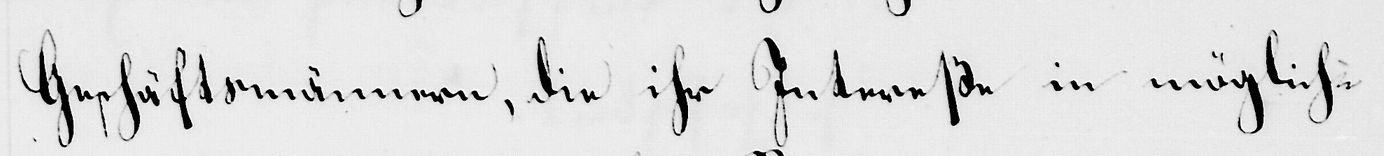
Geschäftsmännern, die ihr Intereße in möglich¬
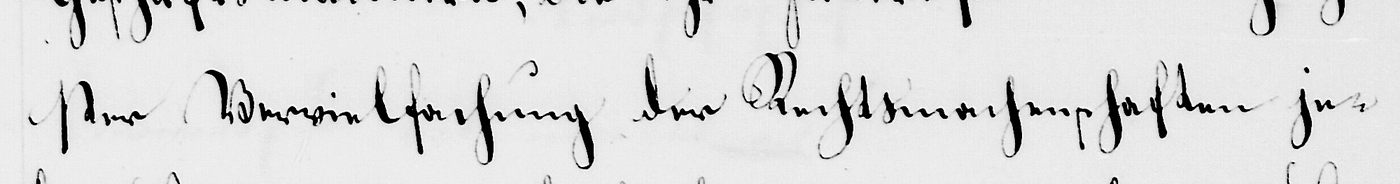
ster Vervielfachung der Rechtsmachenschaften je¬
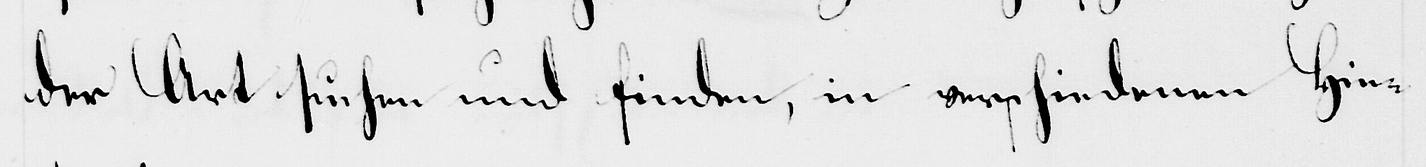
der Art suchen und finden, in verschiedenen Hin¬
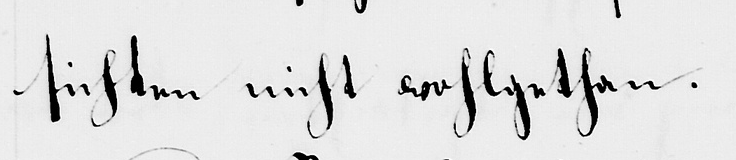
sichten nicht wohlgetan.
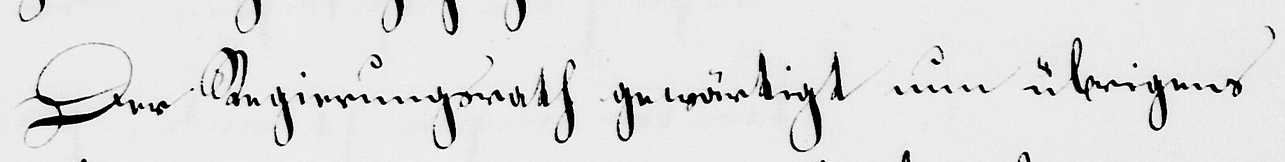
Der Regierungsrath gewärtigt nun übrigens
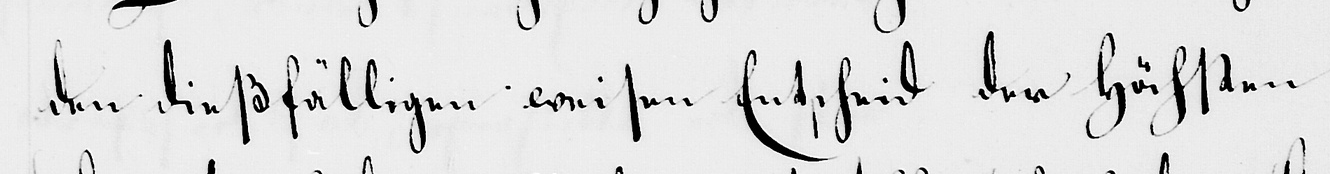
den dießfälligen weisen Entscheid der Höchsten
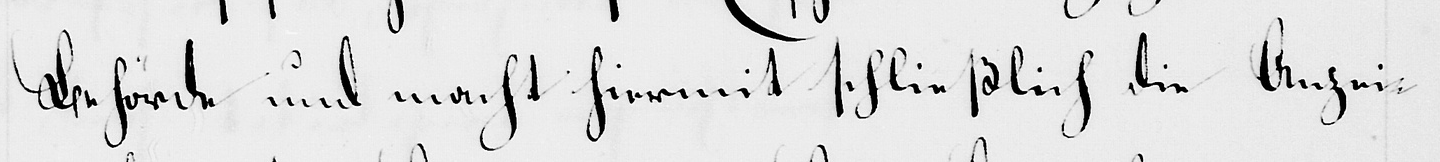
Behörde und macht hiermit schließlich die Anzei¬
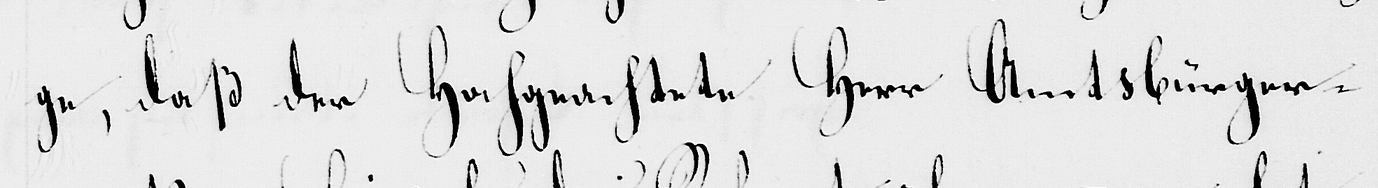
ge, daß der Hochgeachtete Herr Amtsbürger¬
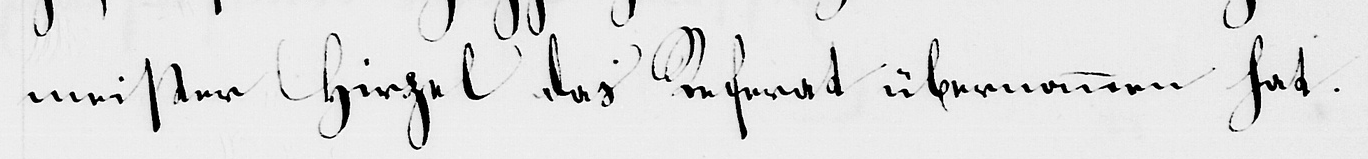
meister Hirzel das Referat übernommen hat.
